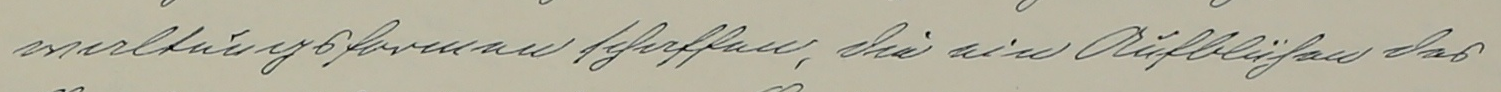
rwaltungsformen schaffen, die ein Aufblühen des
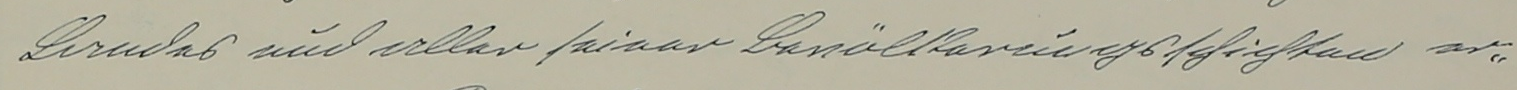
Landes und aller seiner Bevölkerungsschichten er-
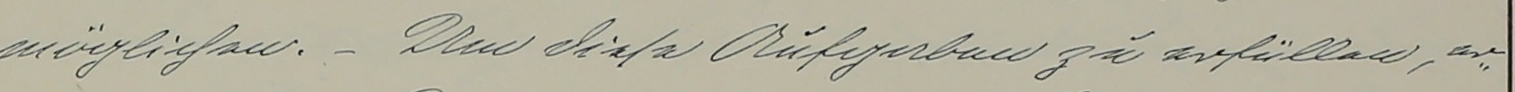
möglichen. – Um diese Aufgaben zu erfüllen, er-
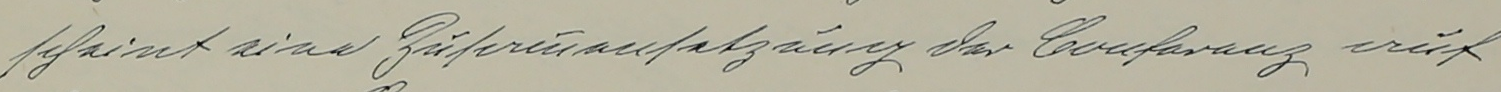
scheint eine Zusammensetzung der Conferenz auf
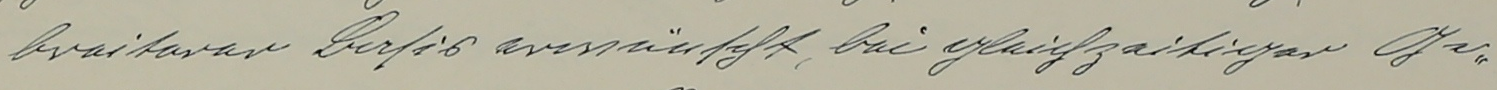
breiterer Basis erwünscht, bei gleichzeitiger Ge-
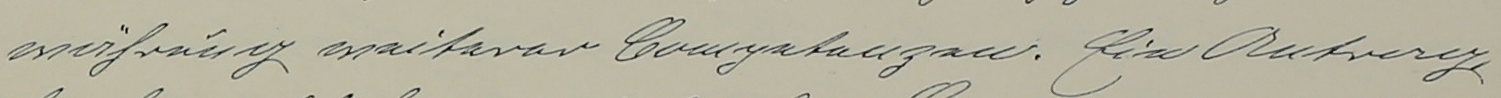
währung weiterer Competenzen. Ein Antrag,
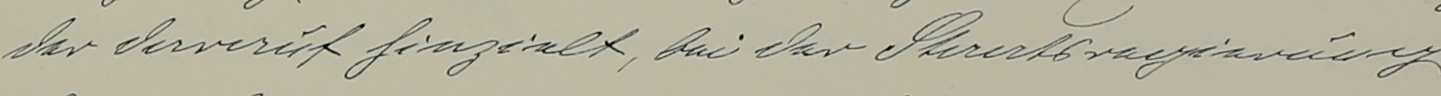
der darauf hinzielt, bei der Staatsregierung
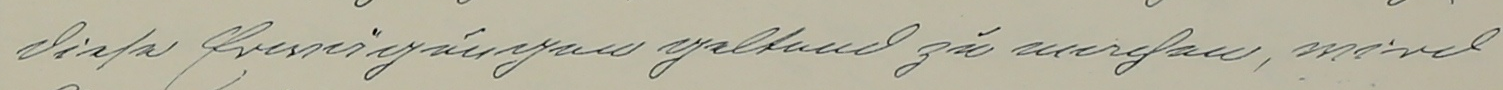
diese Erwägungen geltend zu machen, wird
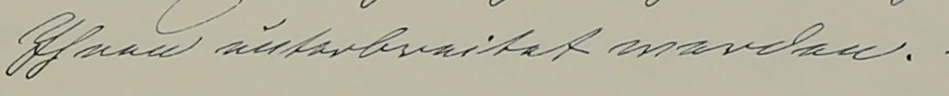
Ihnen unterbreitet werden.
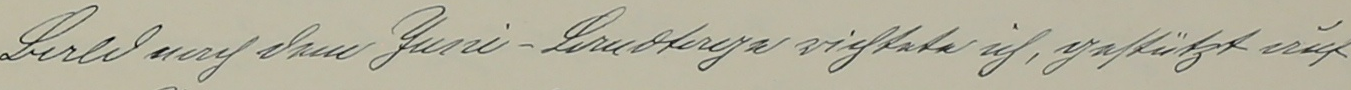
Bald nach dem Juni-Landtage richtete ich, gestützt auf
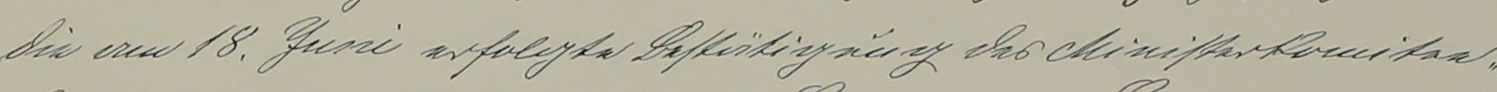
die am 18. Juni erfolgte Bestätigung des Ministerkomitee-
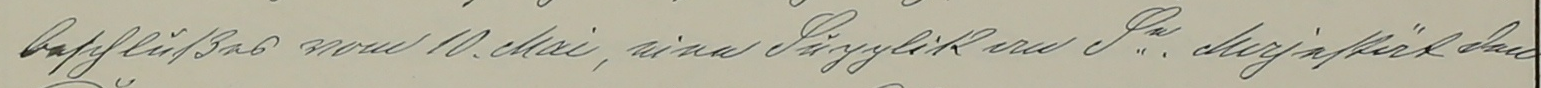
beschlußes vom 10. Mai, eine Supplik an Se. Majestät den
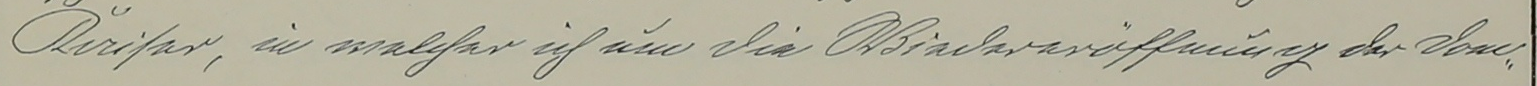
Kaiser, in welcher ich um die Wiedereröffnung der Dom-
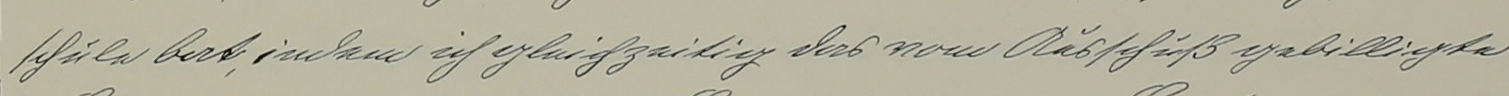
schule bat, indem ich gleichzeitig das vom Ausschuß gebilligte
